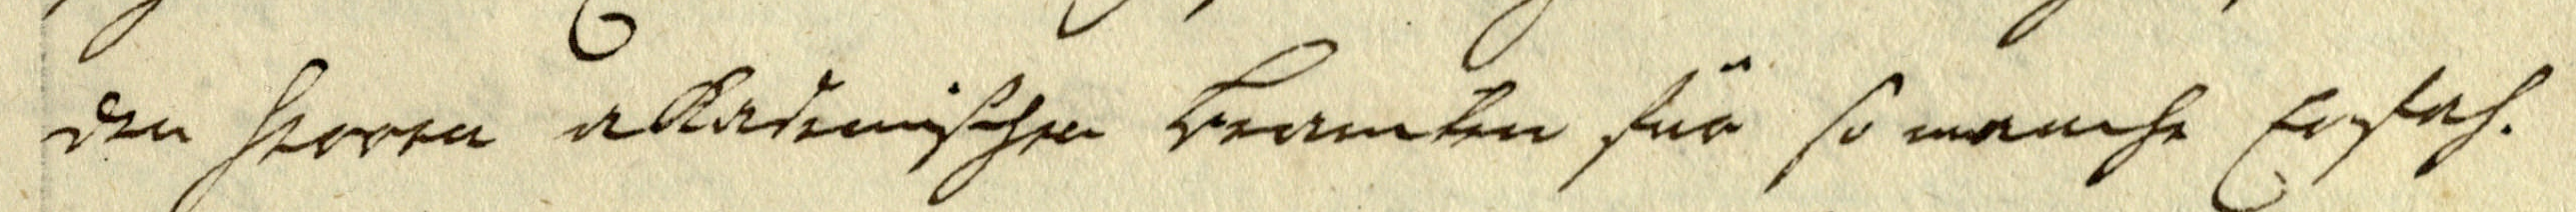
den herren akademischen Beamten für so manche Erfah¬
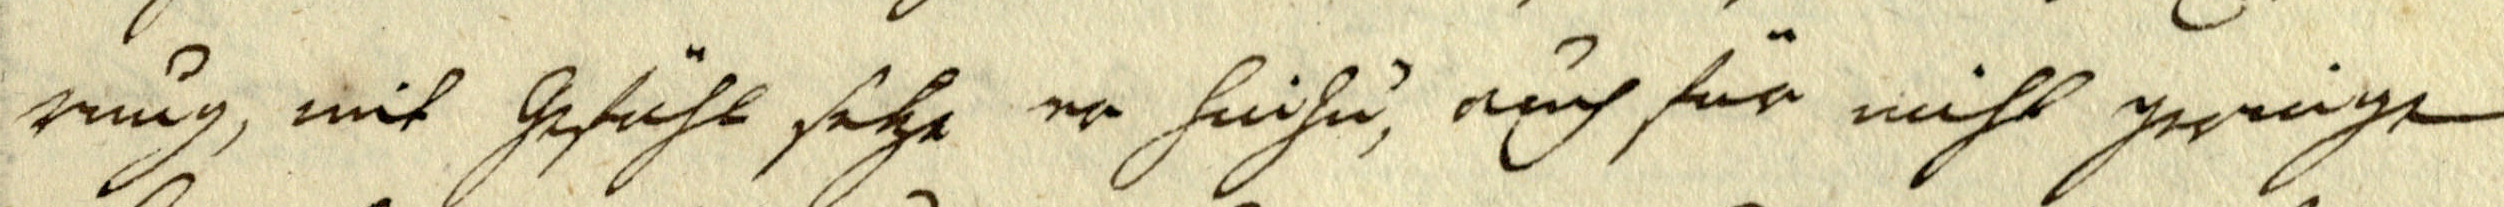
rung, mit Gefühl setze er hinzu, auch für nicht geringe
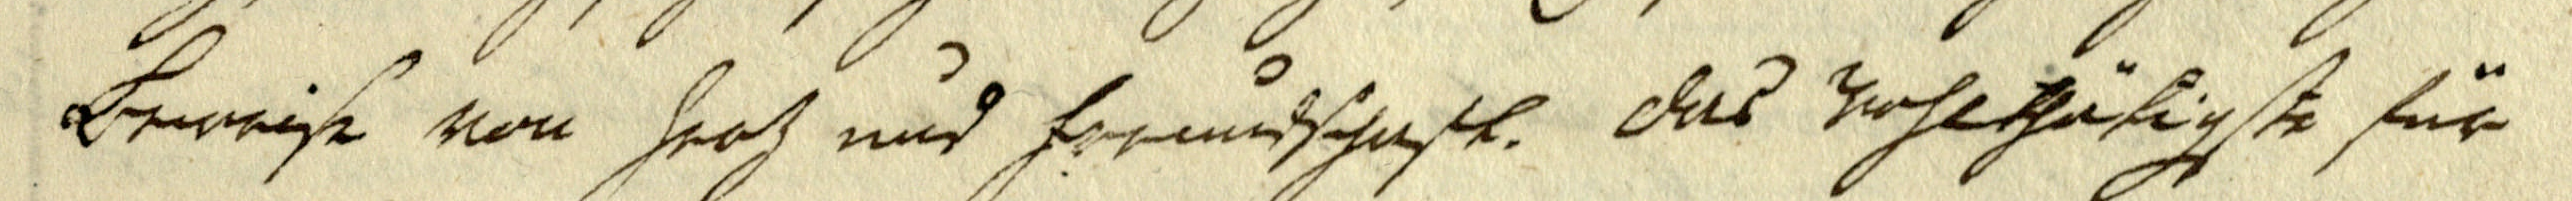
Beweise von herz und Freundschaft. Das Wohlthätigste für
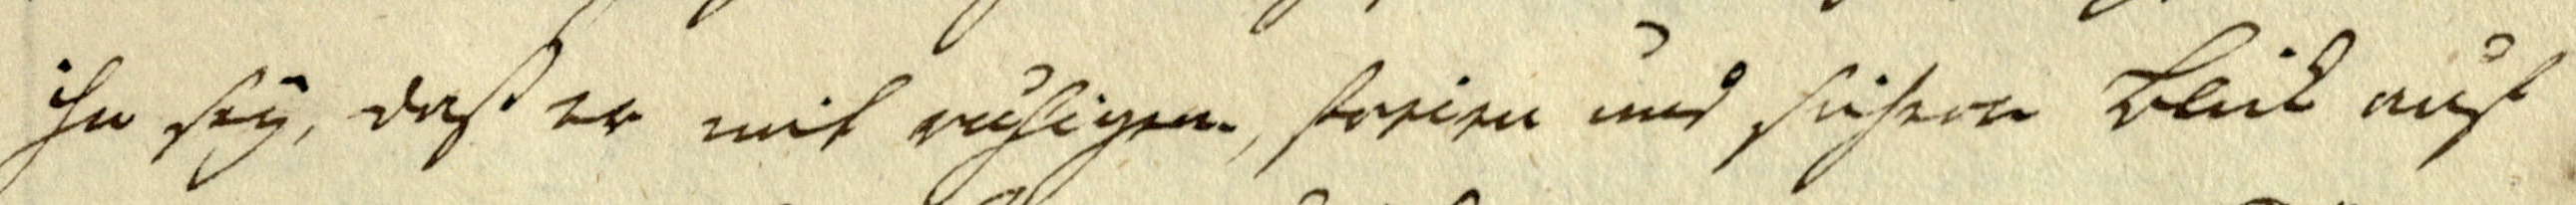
ihn seÿ, daß er mit ruhigem, freien und sicherm Blick auf
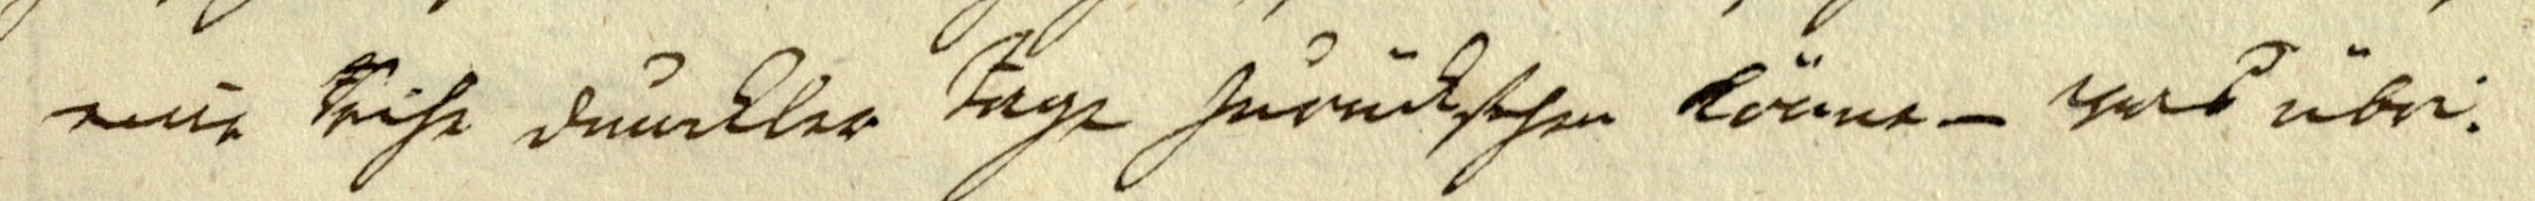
eine Reihe dunckler Tage zurücksehen könne - was übri¬
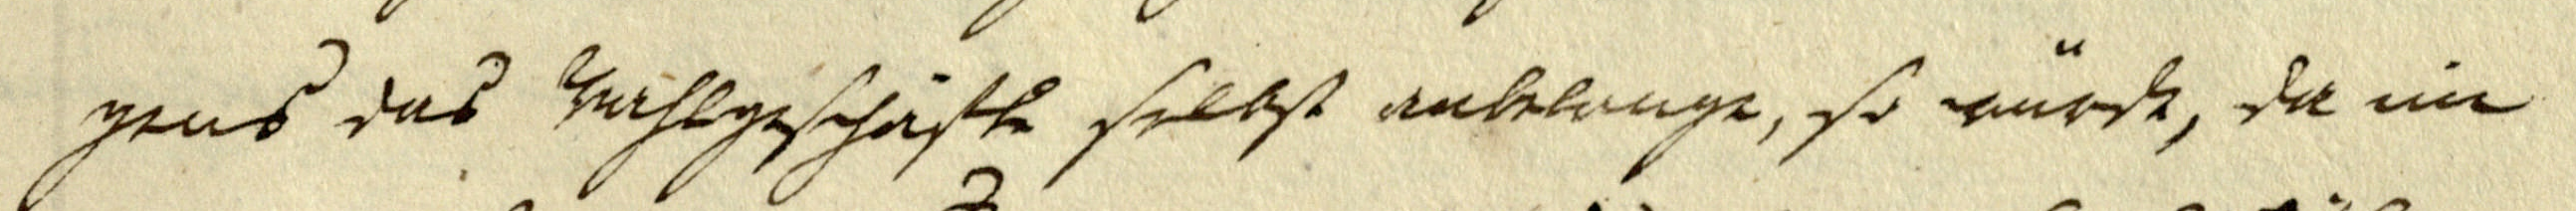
gens das Wahlgeschäft selbst anbelange, so würde, da im
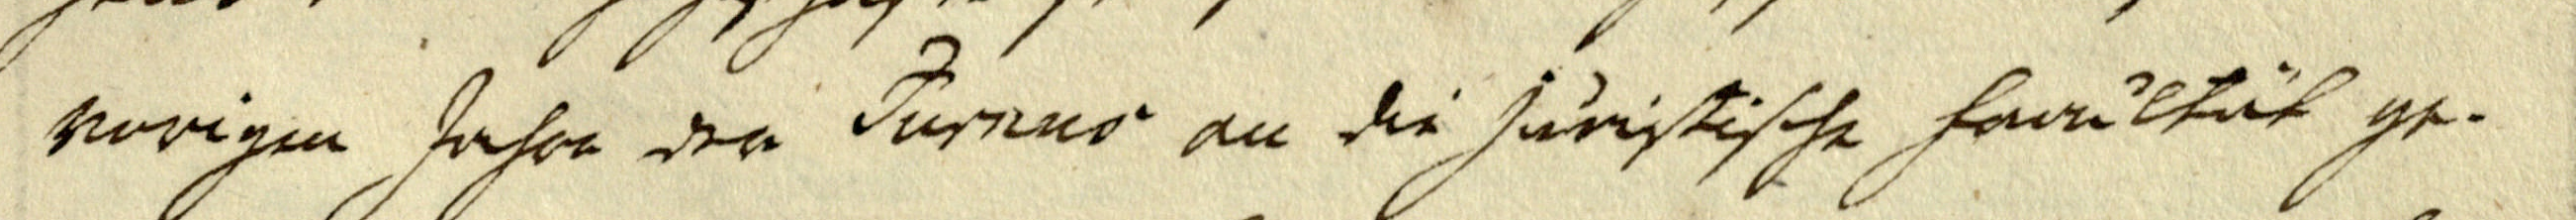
vorigen Jahre der Turnus an die Juristische Facultät ge¬
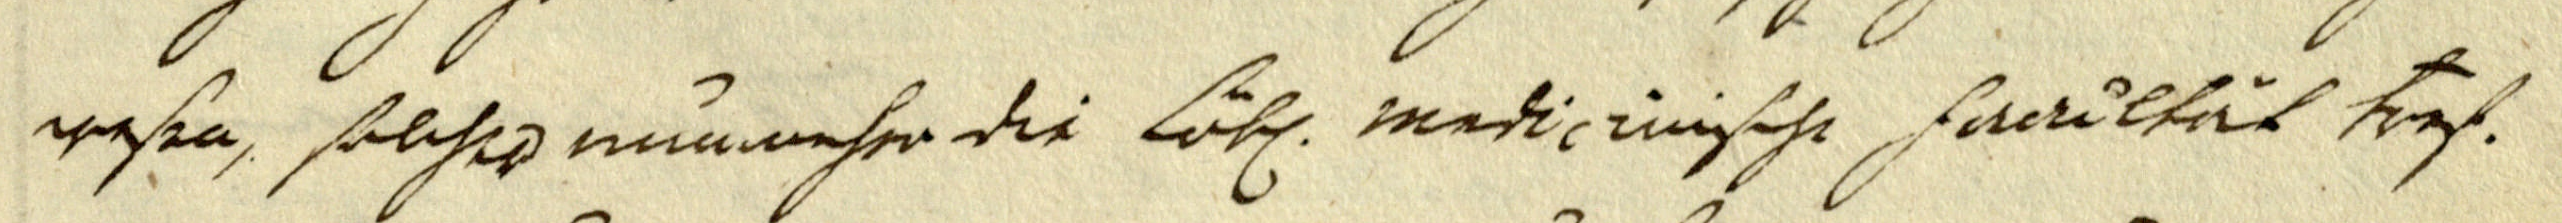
wesen, solches nunmehro die löbl. Medicinische Facultät tref¬
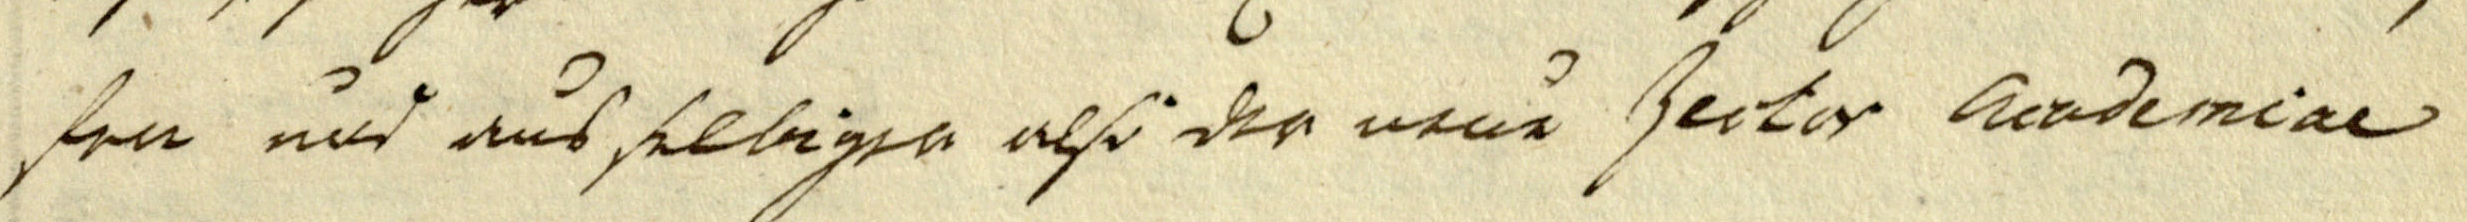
fen und aus selbiger also der neue Rector Academiae
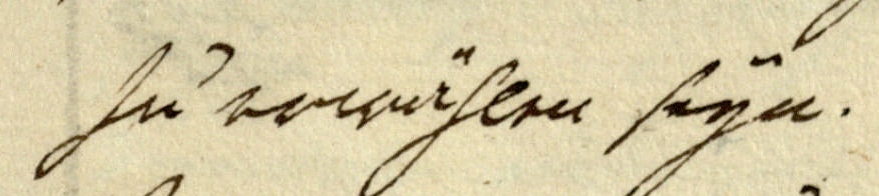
zu erwählen seÿn.
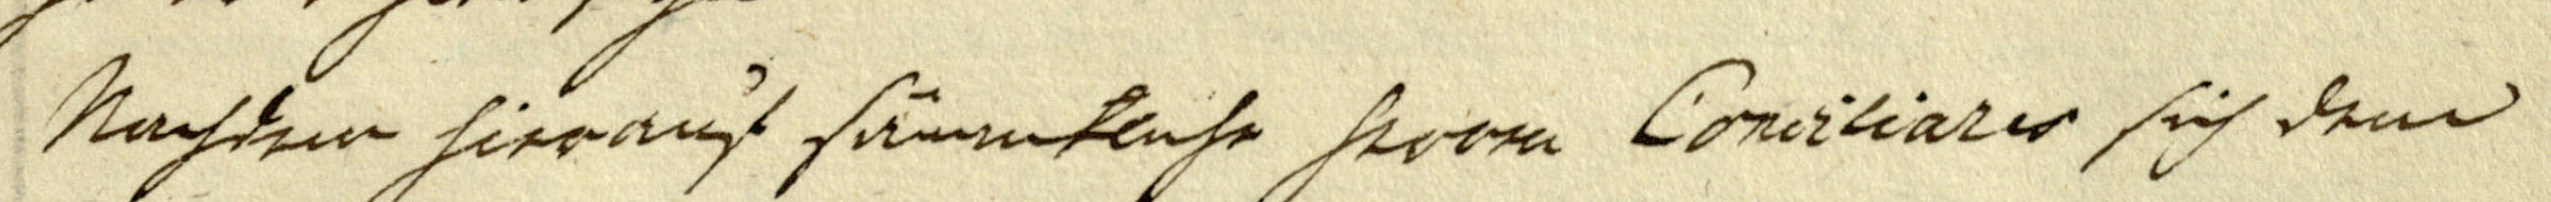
Nachdem hierauf sämmtliche herren Conciliares sich dem
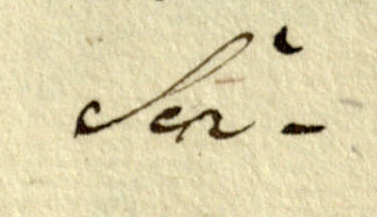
Sen.
